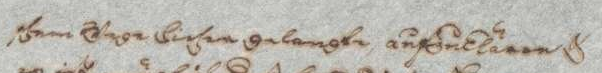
schem Wege hieher gelangte, aufzukären &
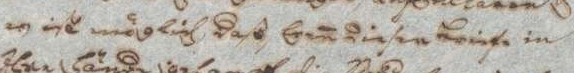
es ist möglich, daß wenn dieser Briefe in
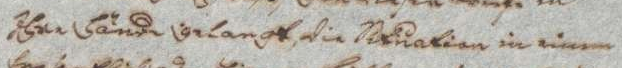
Ihre Hände gelangt, die Situation in einem
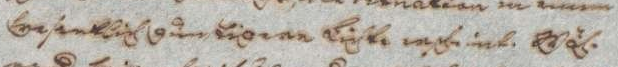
wesentlich günstigern Lichte erscheint. Wäh-
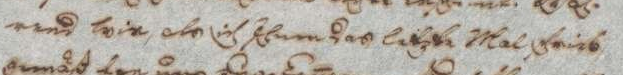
rend wir, als ich Ihnen das letzte Mal schrieb,
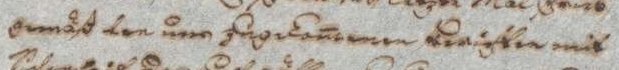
gemäß den uns zugekommenen Berichten mit
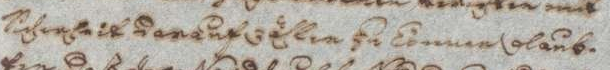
Sicherheit darauf zählen zu können glaub-
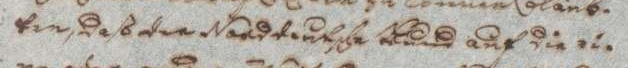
ten, daß der Norddeutsche Bund auf die ein-
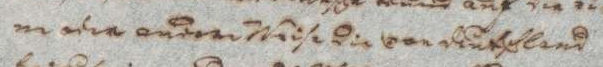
ne oder andere Weise die von Deutschland
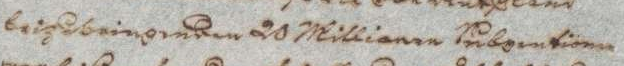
beizubringenden 20 Millionen Subventionen
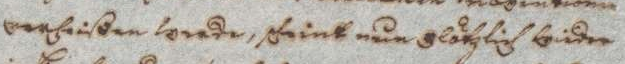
verheißen werde, scheint nun plötzlich wieder
